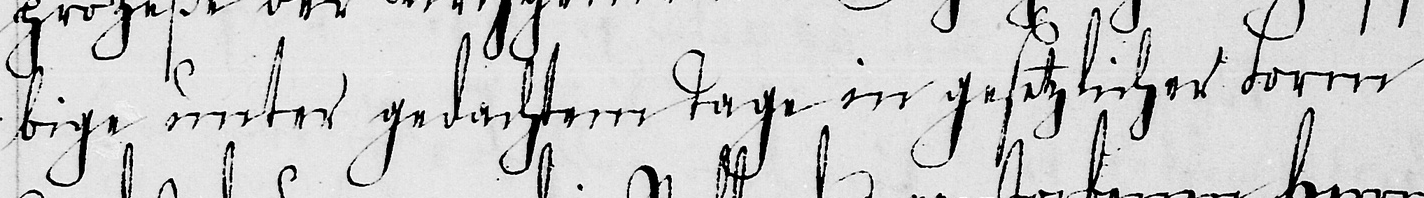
bige unter gedachtem Tage in gesetzlicher Form
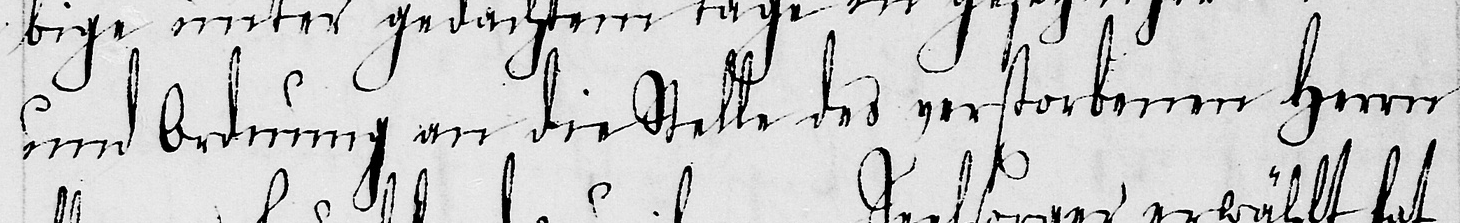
und Ordnung an die Stelle des verstorbenen Herrn
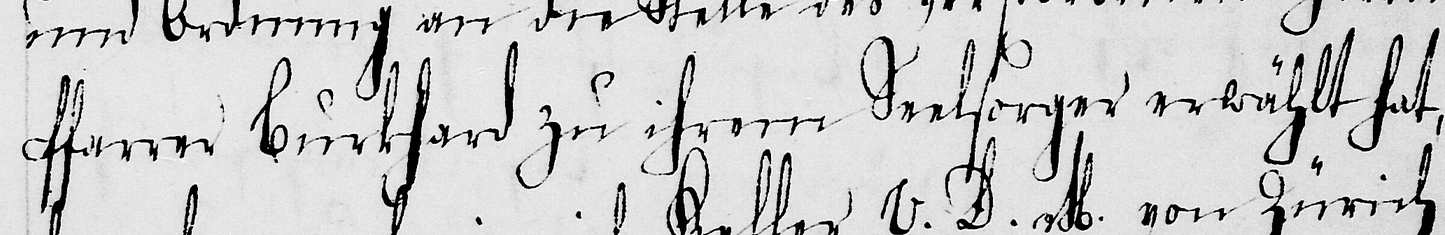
Pfarrer Burkhard zu ihrem Seelsorger erwählt ha¬
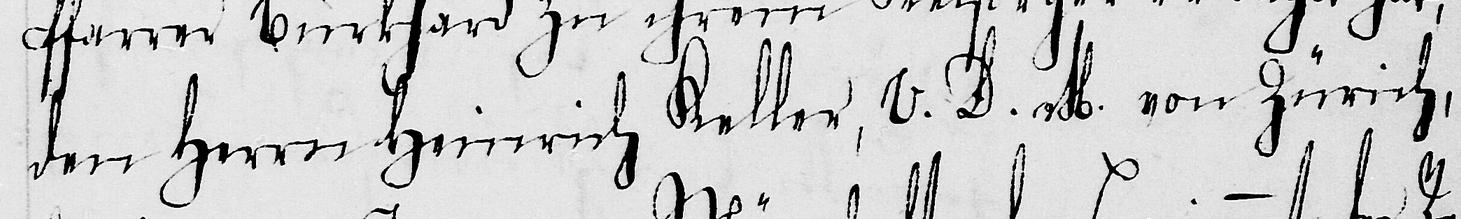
den Herrn Heinrich Keller, V. D. M. von Zürich,
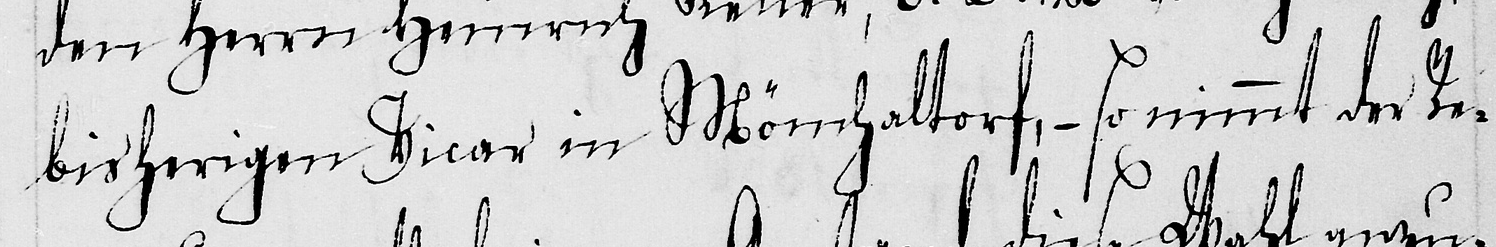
bisheriger Vicar in Mönchaltorf,– so nimmt der Re¬
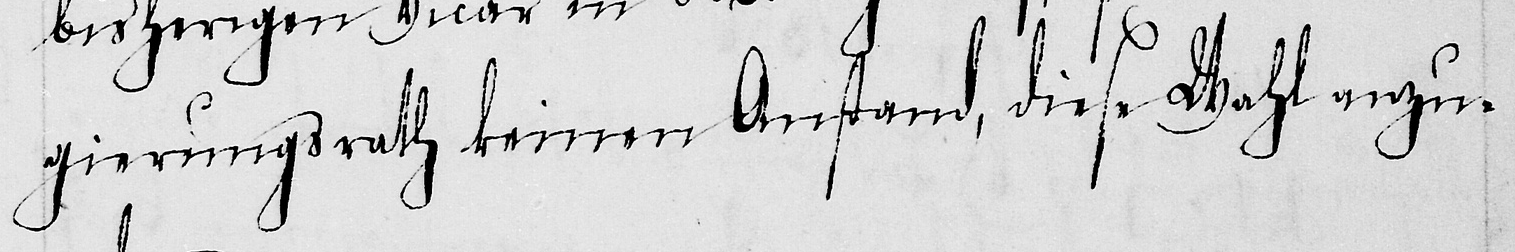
gierungsrath keinen Anstand, diese Wahl anzu¬
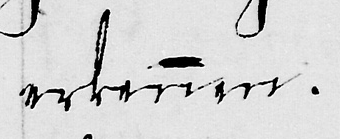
erkennen.
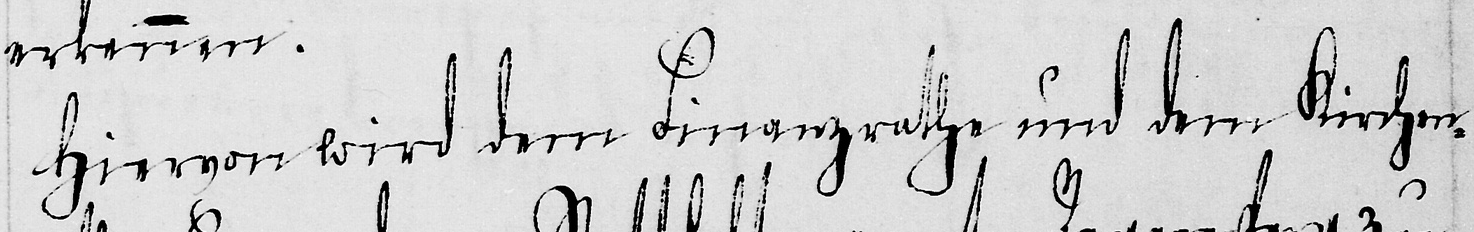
Hiervon wird dem Finanzrathe und dem Kirchen¬
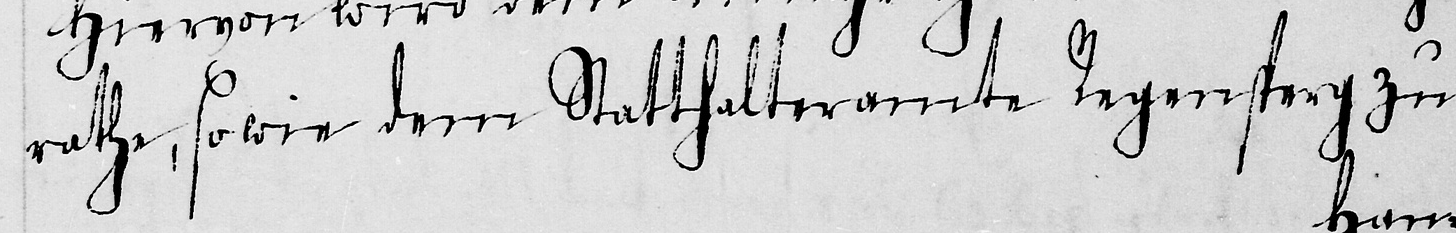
rathe, sowie dem Statthalteramte Regensperg zu
